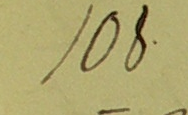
108
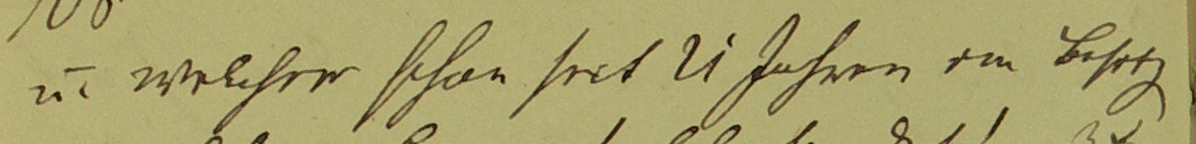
und welcher schon seit 21 Jahren im Besitz
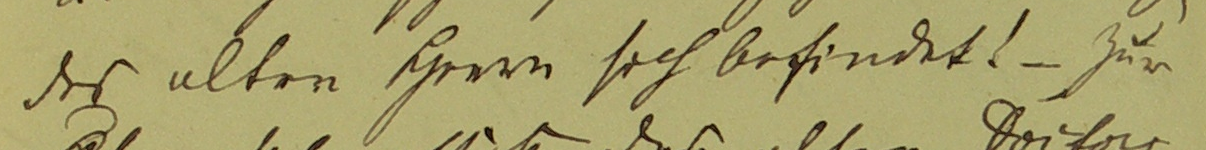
des alten Herrn sich befindet ! - Zur
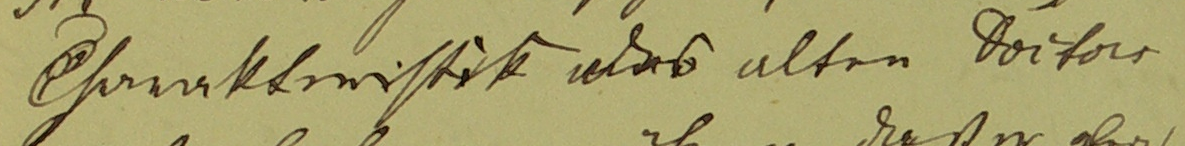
Charakteristik des alten Doctors
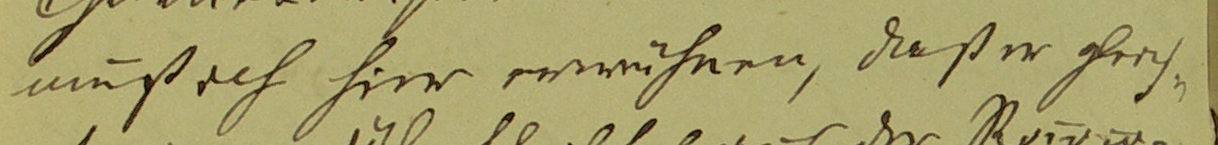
muß ich hier erwähnen, daß er gleich¬
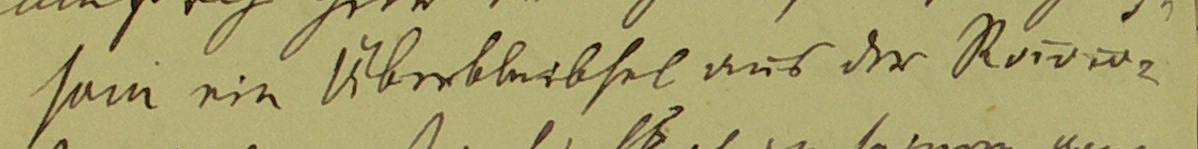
sam ein Überbleibsel aus der Reiviver
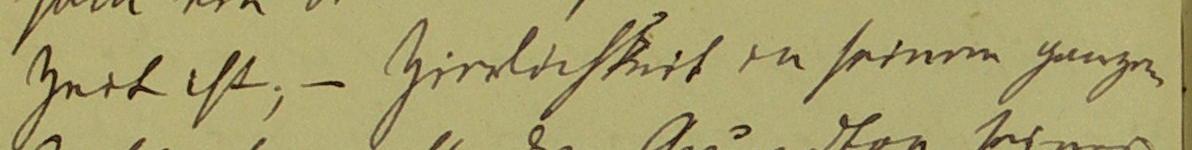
Zeit ist,- Zierlichkeit in seinem ganzen
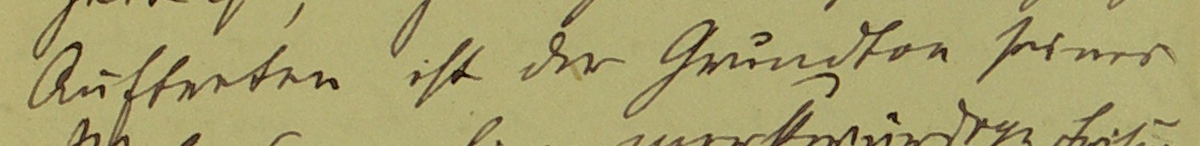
Auftreten ist der Grundthon seines
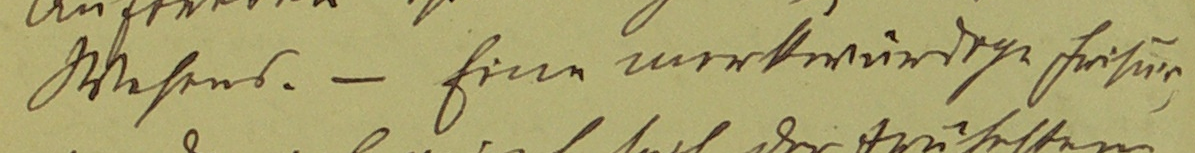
Wesens.- Eine merkwürdige Frisur
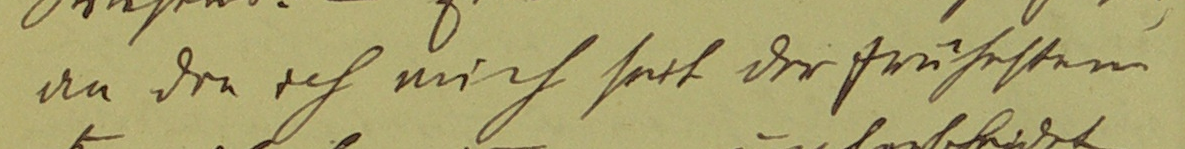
an die ich mich seit der frühesten
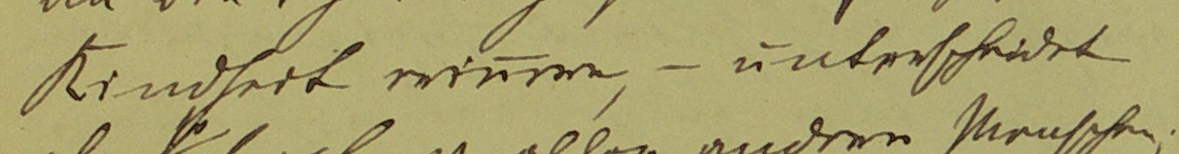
Kindheit erinnere,- unterscheidet
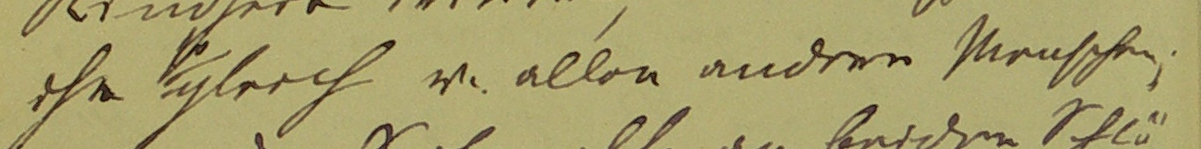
ihn sogleich von allen anderen Menschen;-
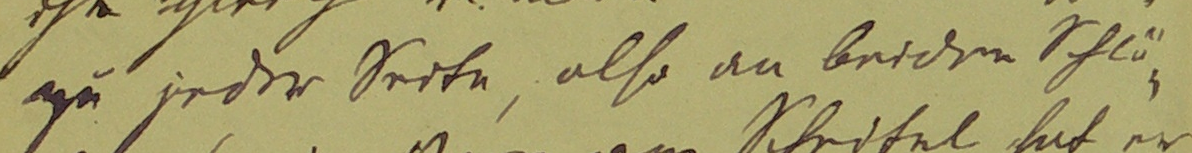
Zu jeder Seite, also an beiden Schlä¬
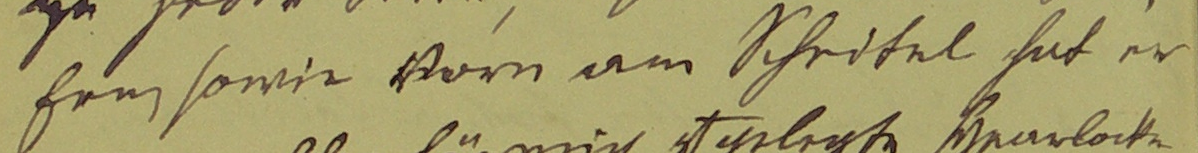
fen sowie vorn am Scheitel hat er
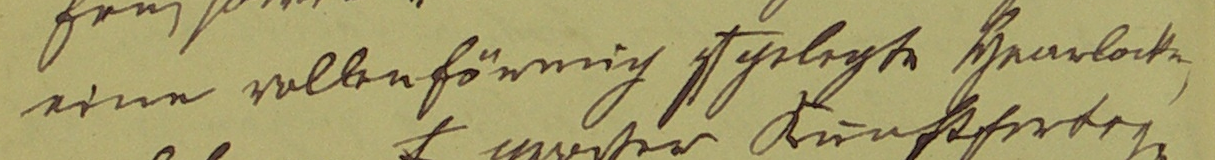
eine wellenförmige aufgelegte Haar locke
